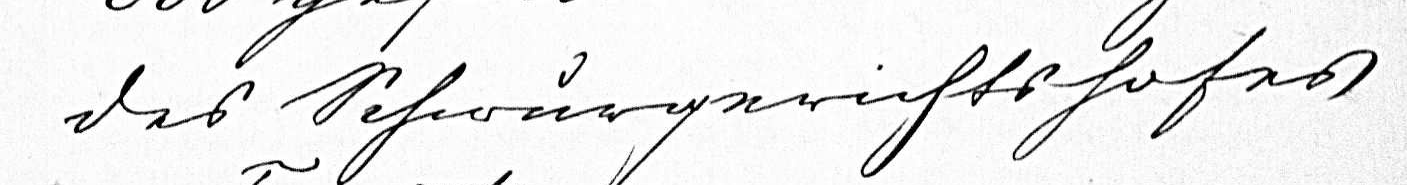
des Schwurgerichtshofes
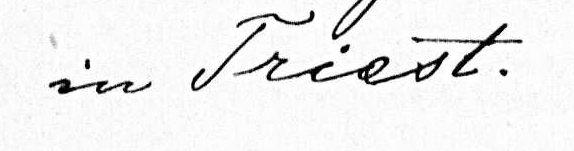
in Triest.
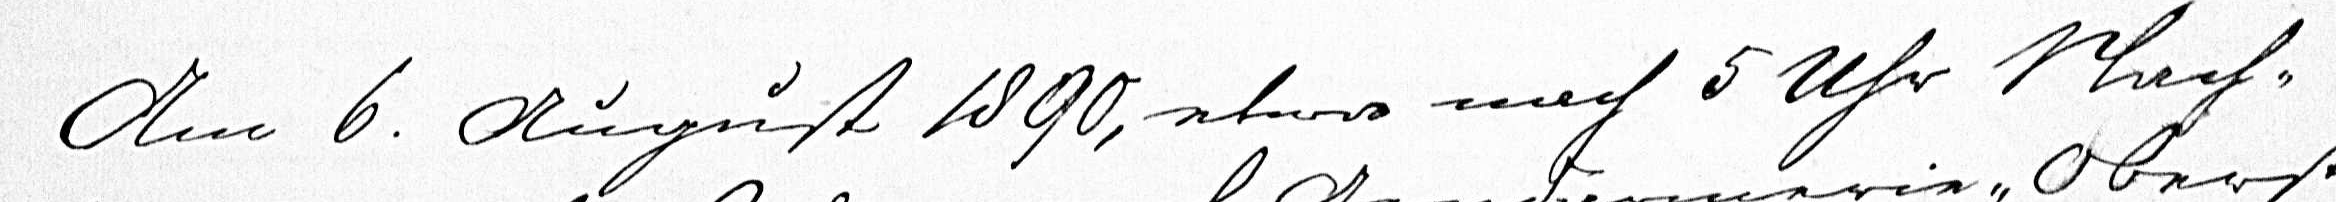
Am 6. August 1890, etwa nach 5 Uhr Nach¬
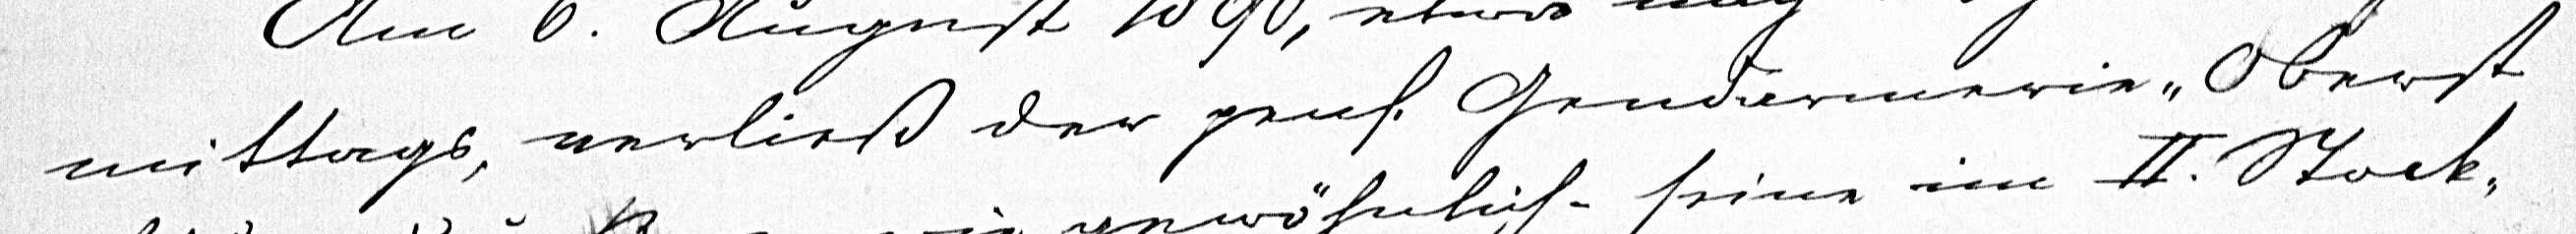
mittags, verließ der pens. Gendarmerie-Oberst
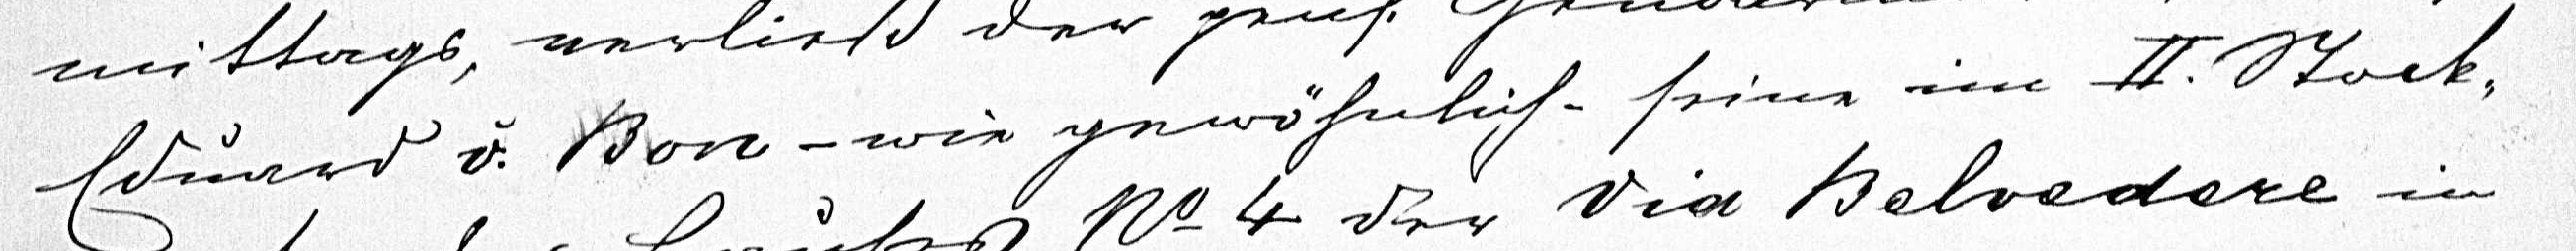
Eduard v. Bon – wie gewöhnlich – seine im II. Stock¬
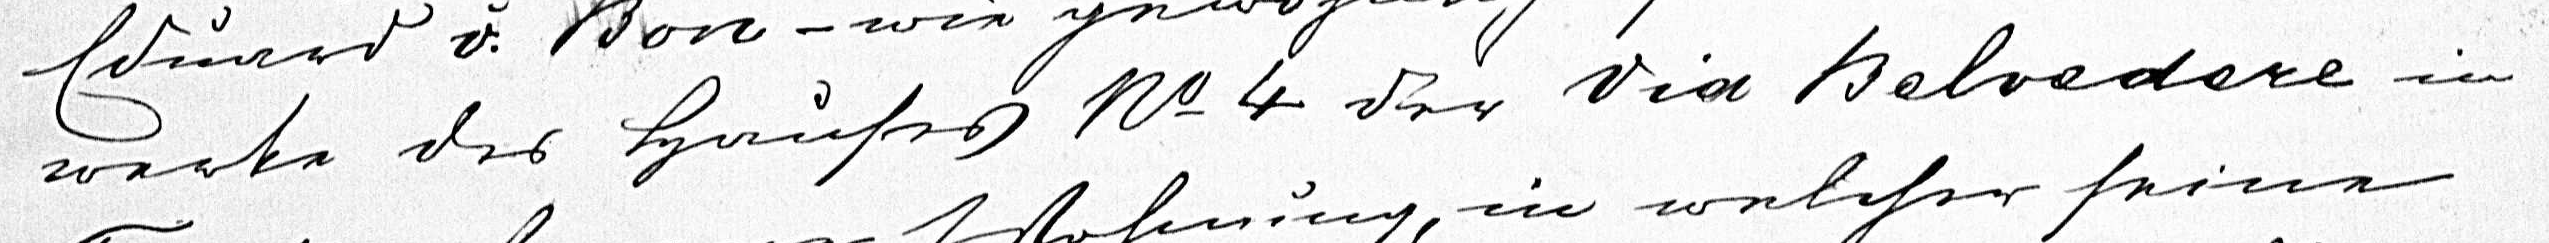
werke des Hauses No. 4 der Via Belvedere in
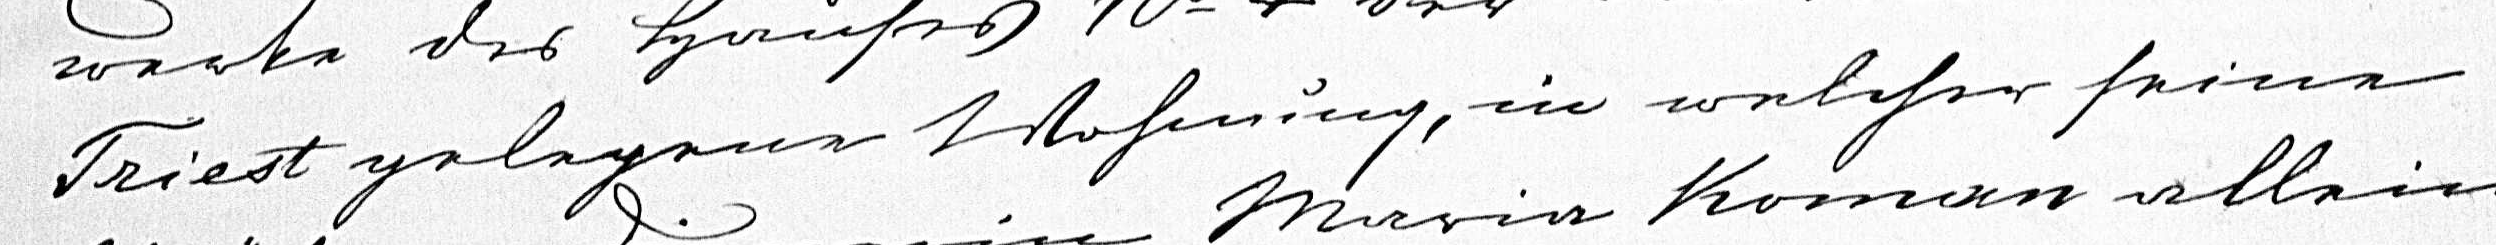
Triest gelegenen Wohnung, in welcher seine
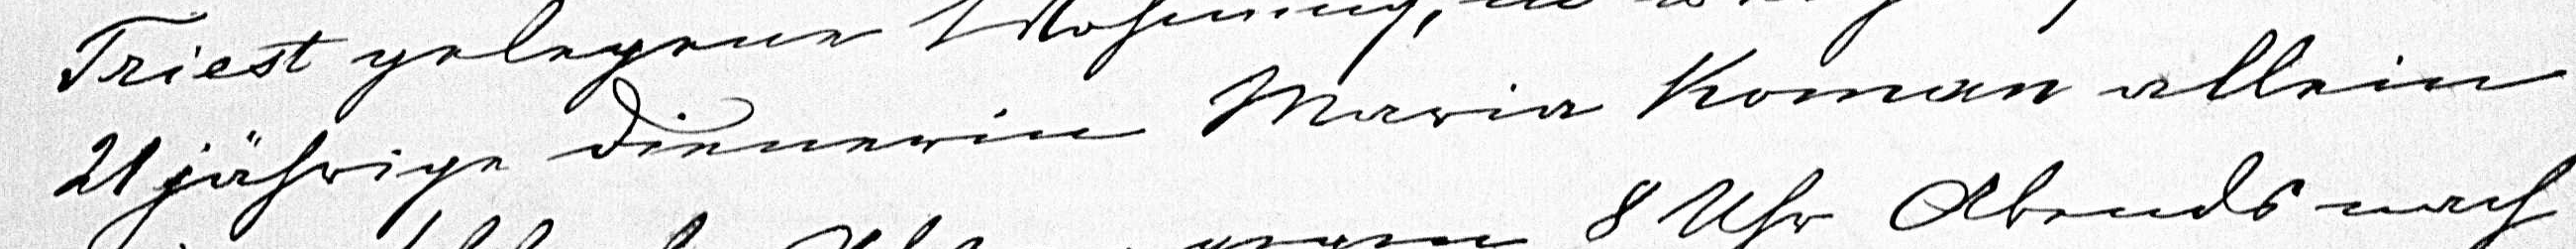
21jährige Dienerin Maria Koman allein
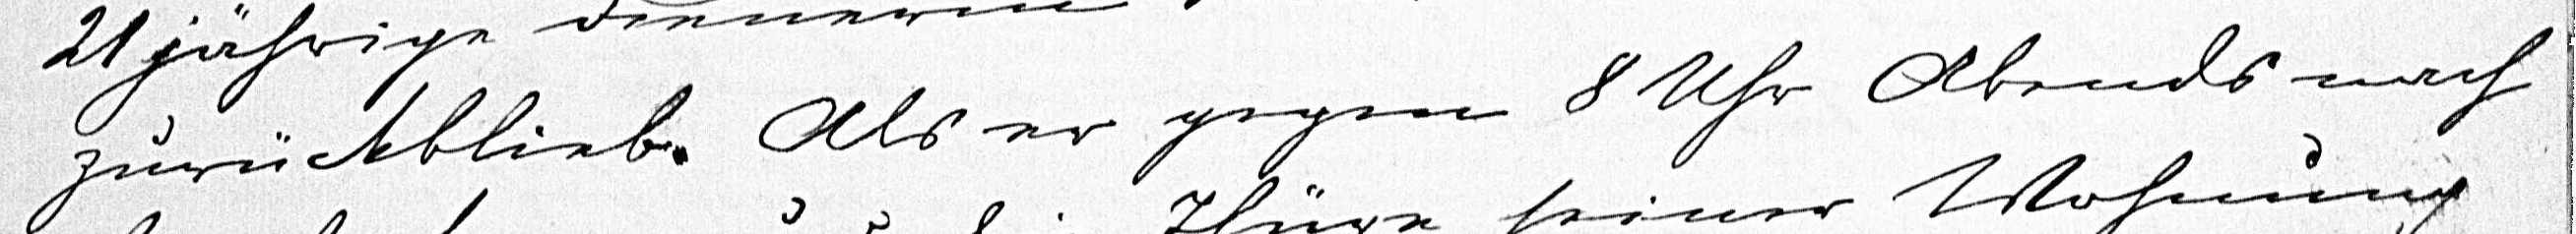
zurückblieb. Als er gegen 8 Uhr Abends nach
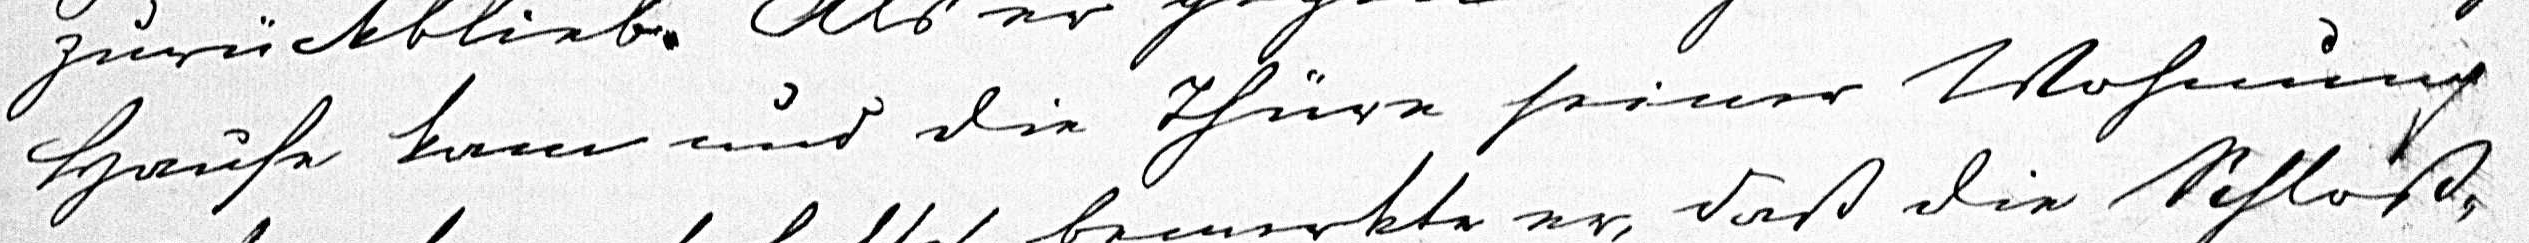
Hause kam und die Thüre seiner Wohnung
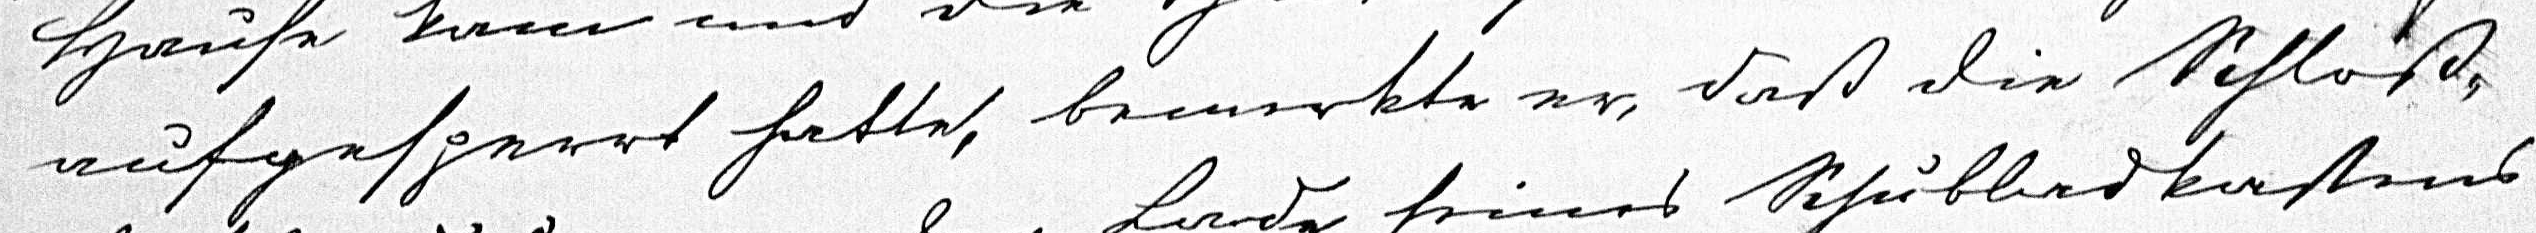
aufgesperrt hatte, bemerkte er, daß die Schloß¬
